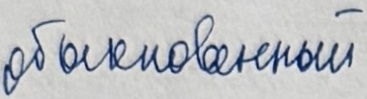обыкновенный
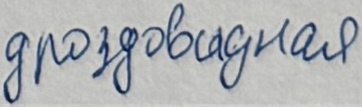дроздовидная
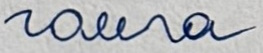чомга
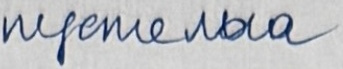пустельга
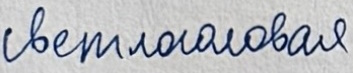светлоголовая
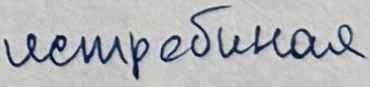ястребиная
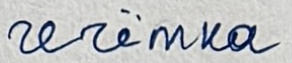чечётка
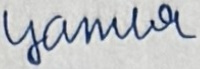цапля
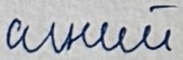синий
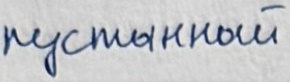пустынный
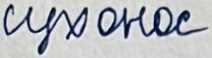сухонос
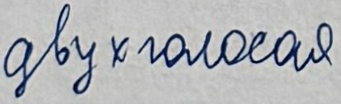двухголосая
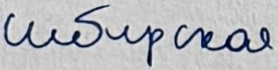сибирская
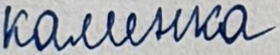каменка
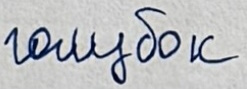голубок
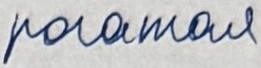рогатая
